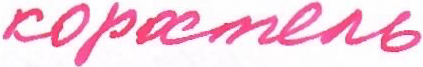коростель
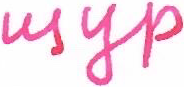щур
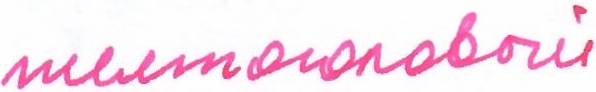желтоголовый
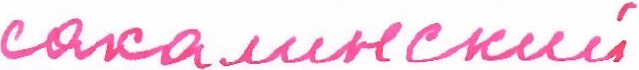сахалинский
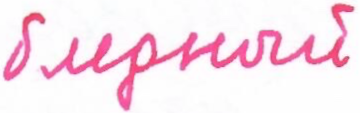бледный
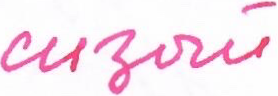сизый
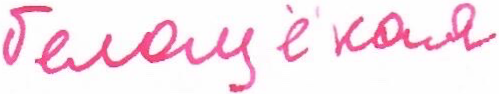белощёкая
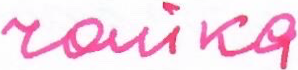чайка
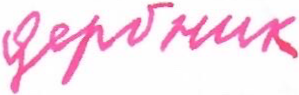дербник
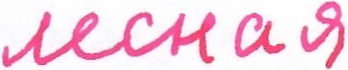лесная
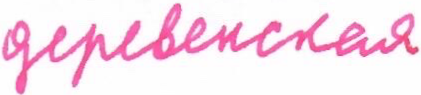деревенская
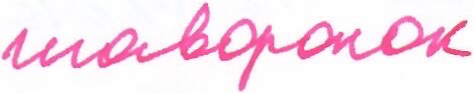жаворонок
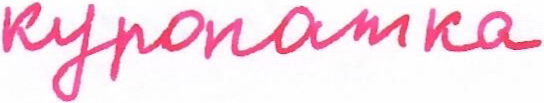куропатка
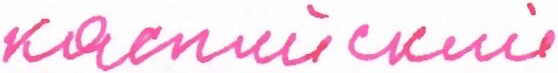каспийский
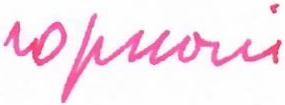горный
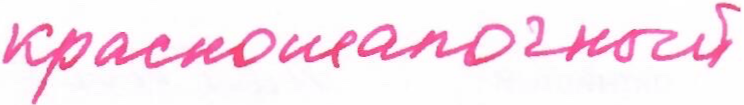красношапочный
